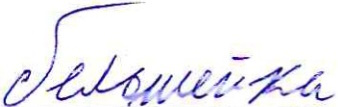белошейка
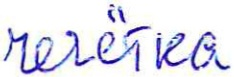чечётка
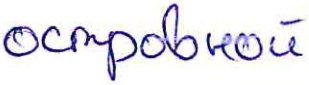островной
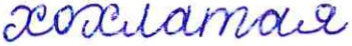хохлатая
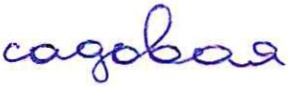садовая
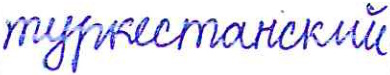туркестанский
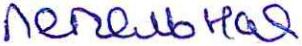пепельная
